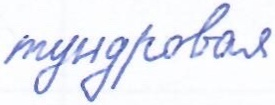тундровая
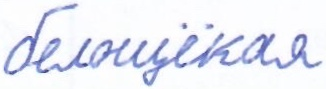белощёкая
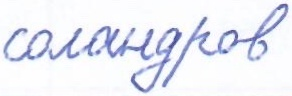соландров
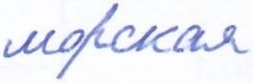морская
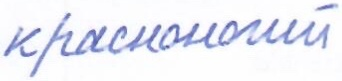красноногий
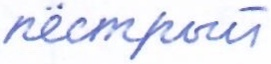пёстрый
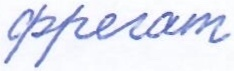фрегат
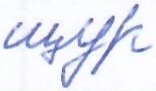щур
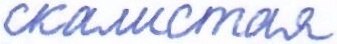скалистая
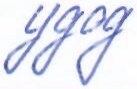удод
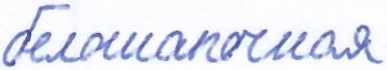белошапочная
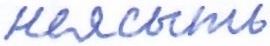неясыть
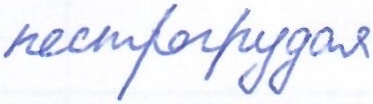пестрогрудая
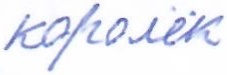королёк
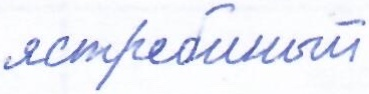ястребиный
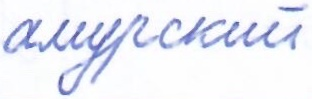амурский
